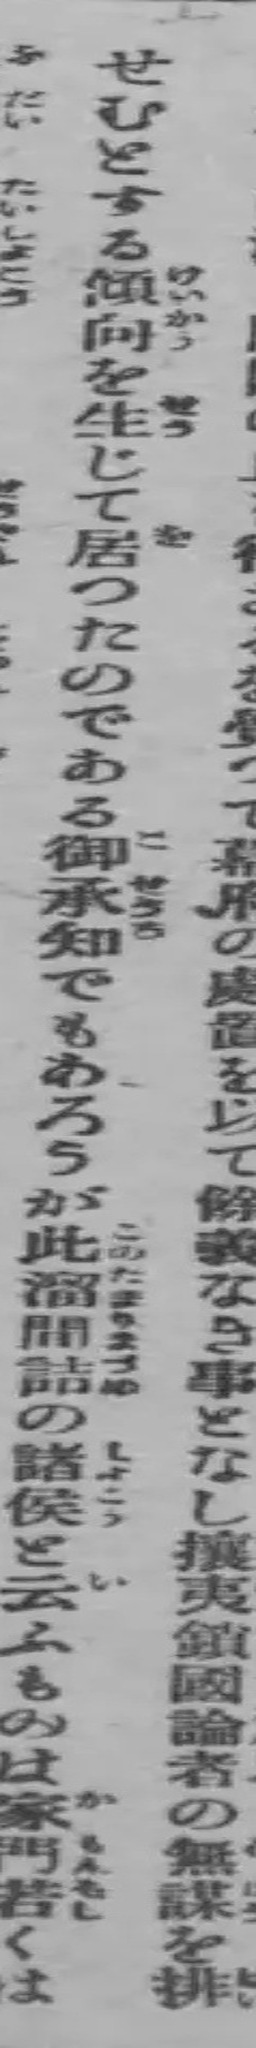せむとする傾向を生じて居つたのである御承知でもあろうが此溜間詰の諸侯と云ふものは家門若くは
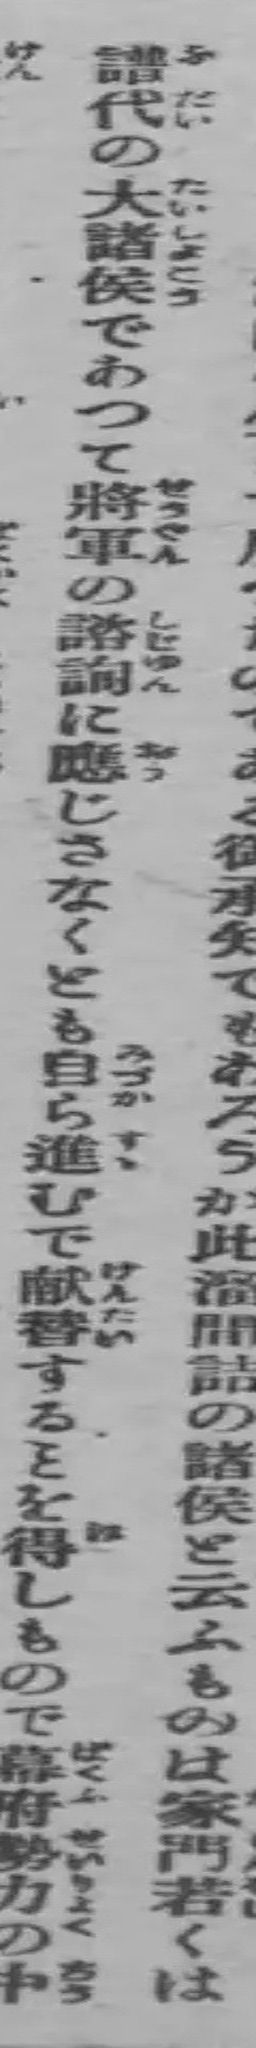譜代の大諸侯であつて将軍の諮詢に応じさなくとも自ら進むで献替することを得しもので幕府勢力の中
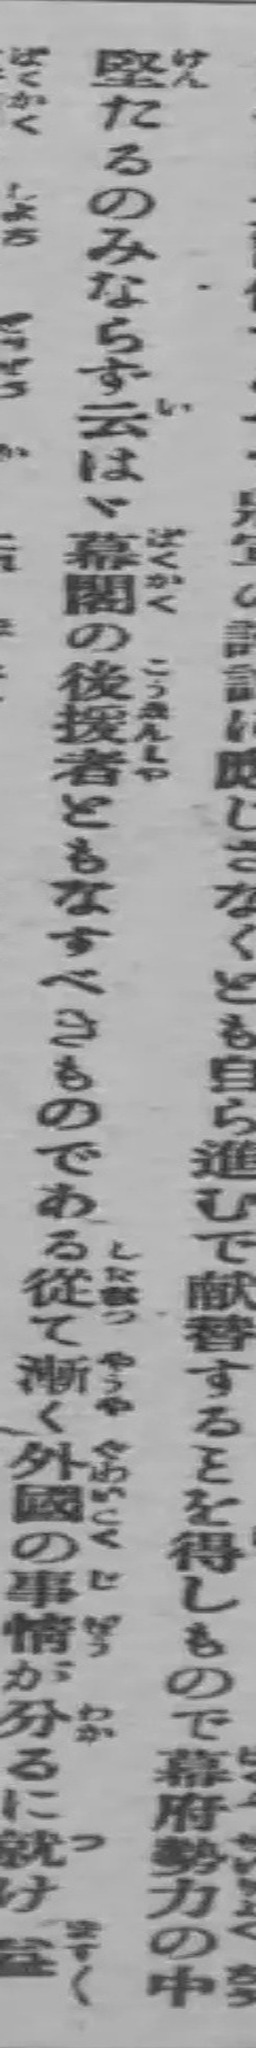堅たるのみならず云はゞ幕閣の後援者ともなすべきものである従て漸く外国の事情が分るに就け益
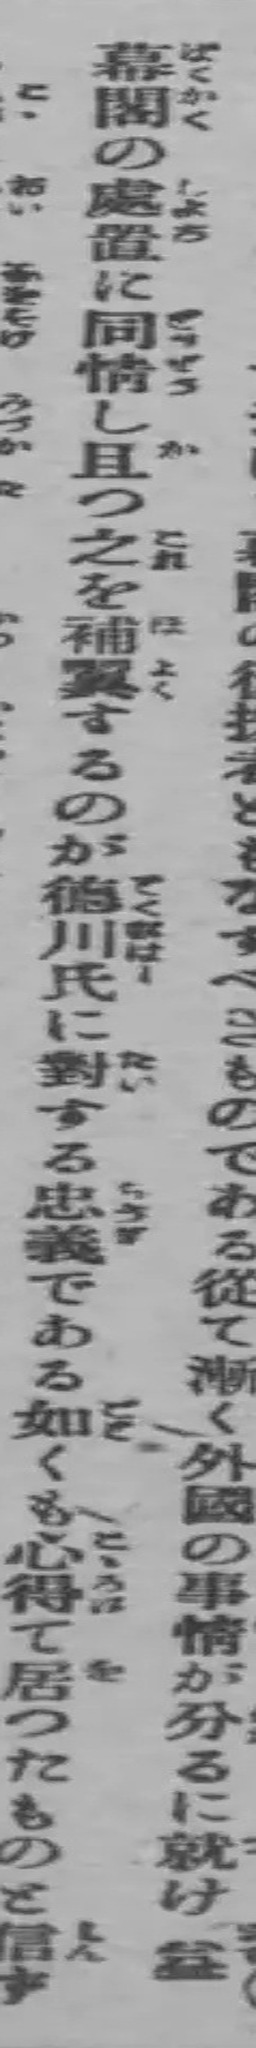幕閣の処置に同情し且つ之を補翼するのが徳川氏に対する忠義である如くも心得て居つたものと信ず
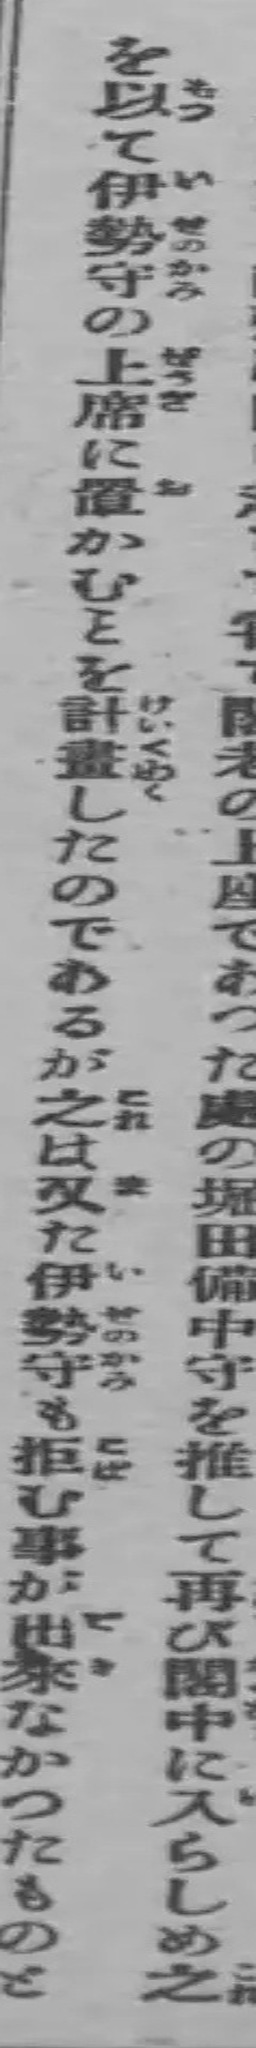を以て伊勢守の上座に置かむことを計画したのであるが之は又た伊勢守も拒む事が出来なかつたものと
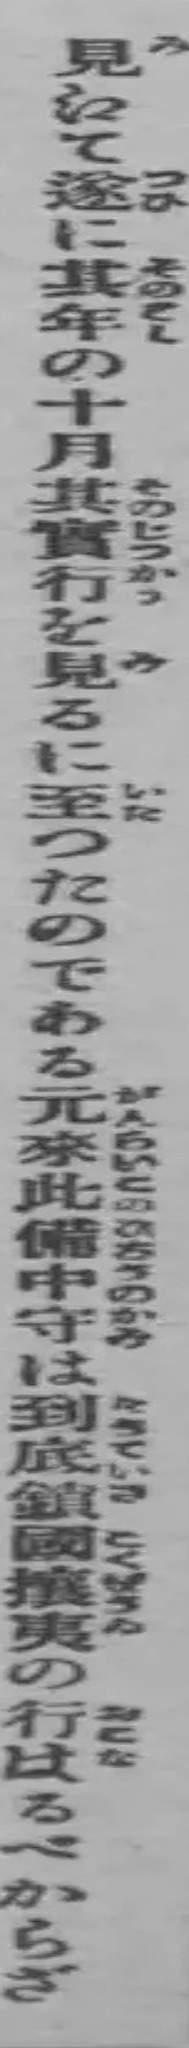見えて遂に其年の十月其実行を見るに至つたのである元来此備中守は到底鎖国攘夷の行はるべからざ
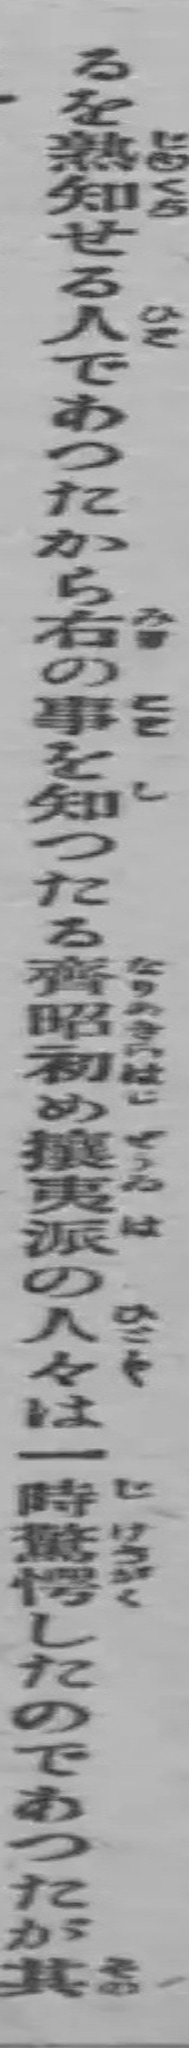るを熟知せる人であつたから右の事を知つたる斉昭初め攘夷派の人々は一時驚愕したのであつたが其
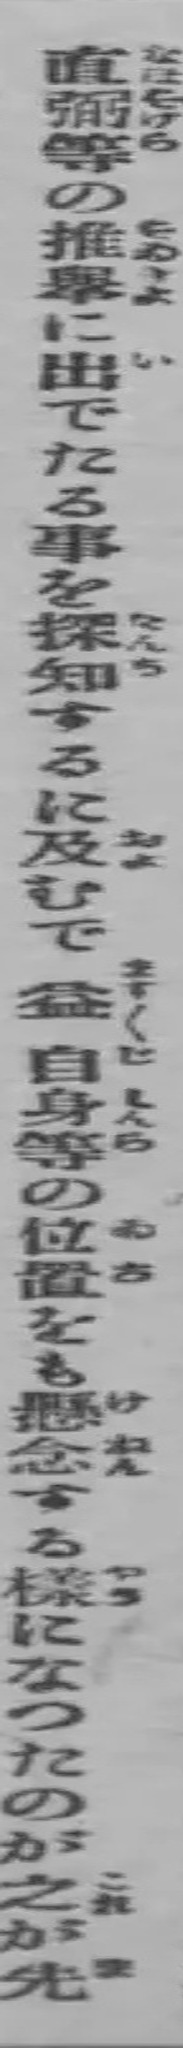直弼等の推挙に出でたる事を探知するに及むで益自身等の位置をも懸念する様になつたのが之が先
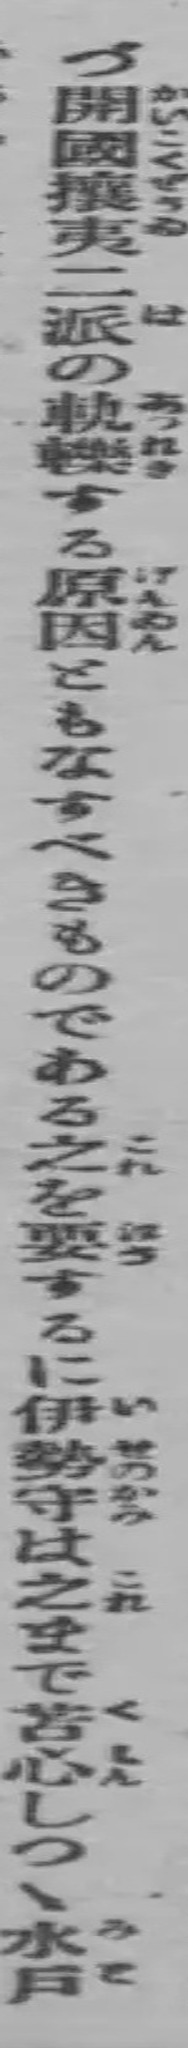づ開国攘夷二派の軋轢する原因ともなすべきものである之を要するに伊勢守は之まで苦心しつゝ水戸
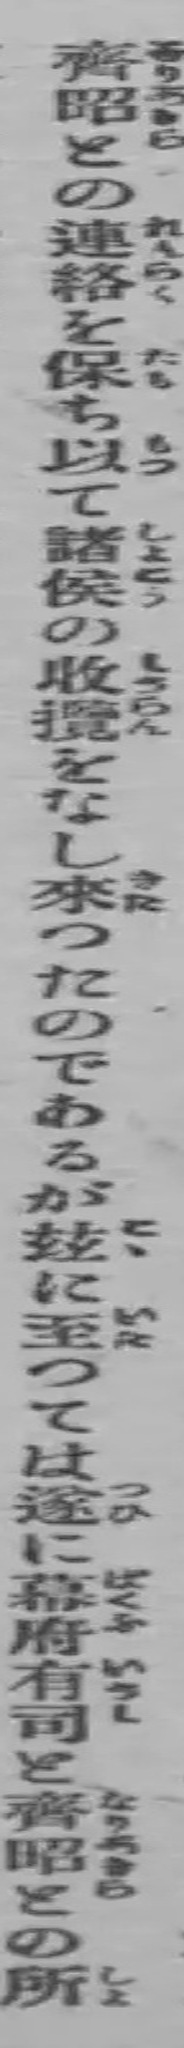斉昭との連絡を保ち以て諸侯の収攬をなし来つたのであるが茲に至つては遂に幕府有士と斉昭との所
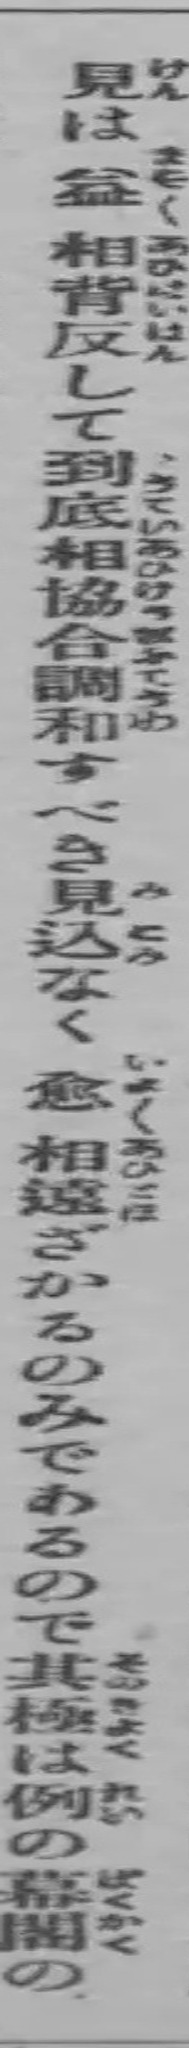見は益相背反して到底相協合調和すべき見込なく愈相遠ざかるのみであるので其極は例の幕閣の
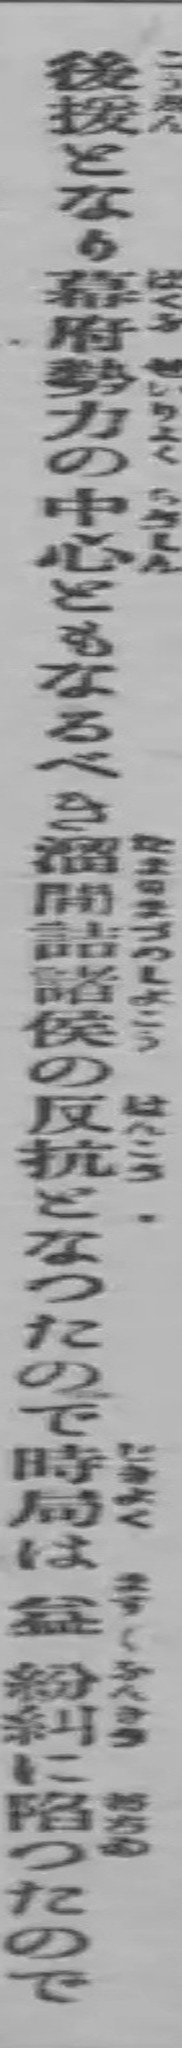後援となり幕府勢力の中心ともなるべき溜間詰諸侯の反抗となつたので時局は益紛糾に陥つたので
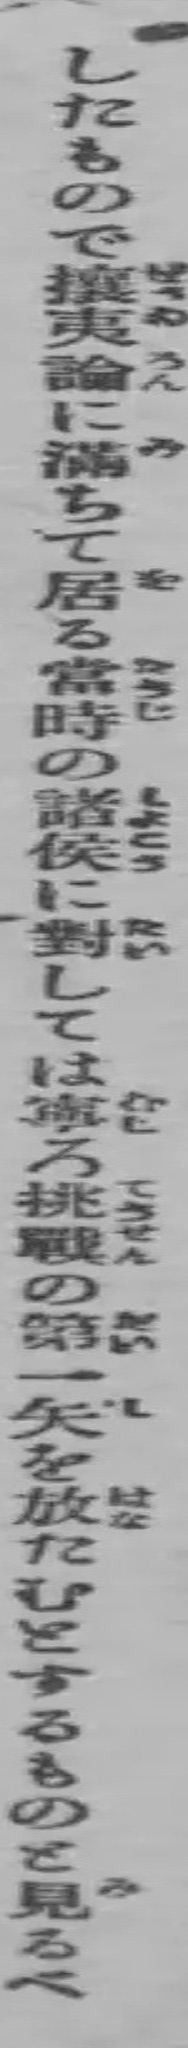したもので攘夷論に満ちて居る当時の諸侯に対しては寧ろ挑戦の第一矢を放たむとするものと見るべ
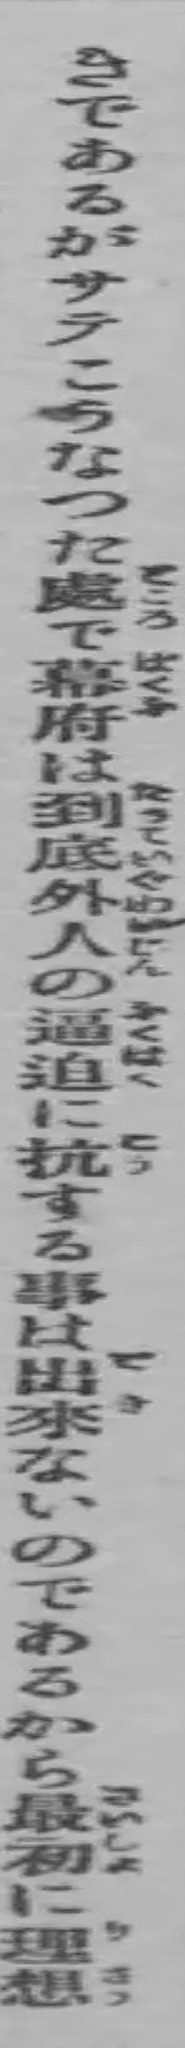きであるがサテこうなつた処で幕府は到底外人の逼迫に抗する事は出来ないのであるから最初に理想
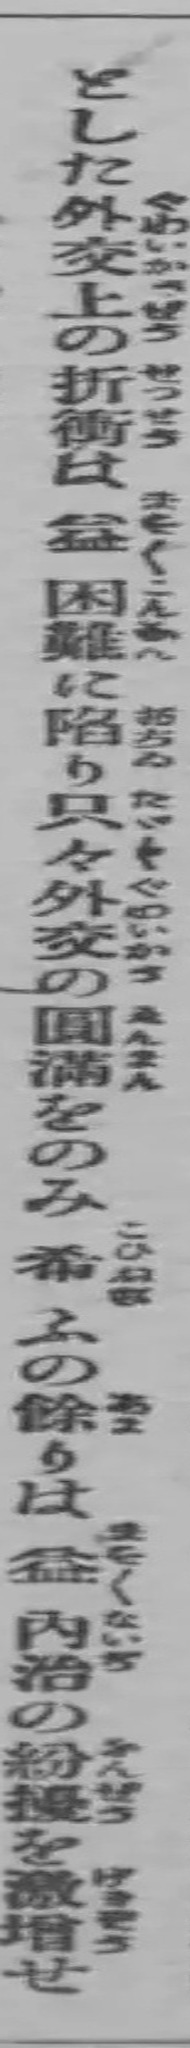とした外交上の折衝は益困難に陥り只々外交の円満をのみ希ふの余りは益々内治の紛擾を激増せ
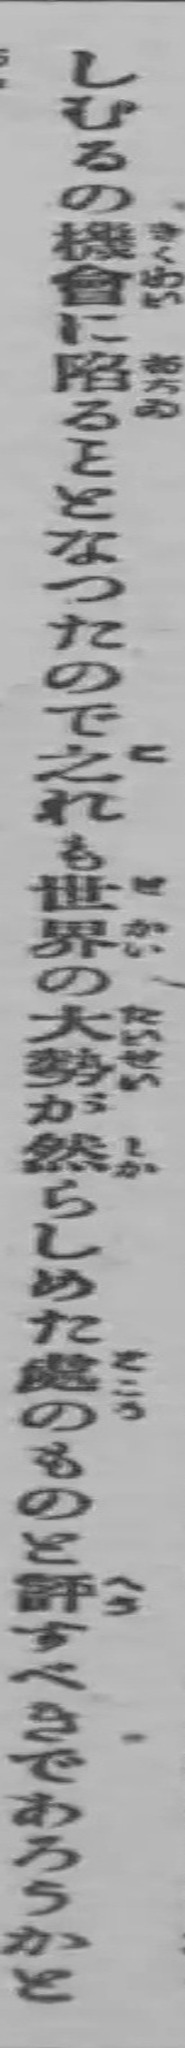しむるの機会に陥ることとなつたので之れも世界の大勢が然らしめた処のものと評すべきであろうかと
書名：豊橋市史談
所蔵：国立国会図書館 National Diet Library, JAPAN
